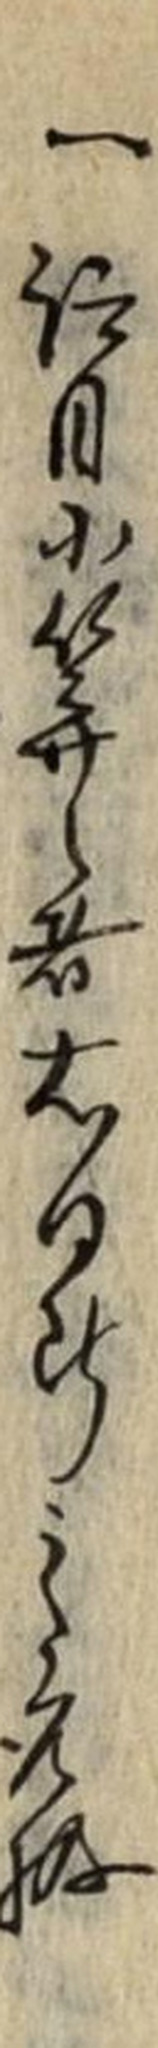一跡目小算之者右同断之取扱
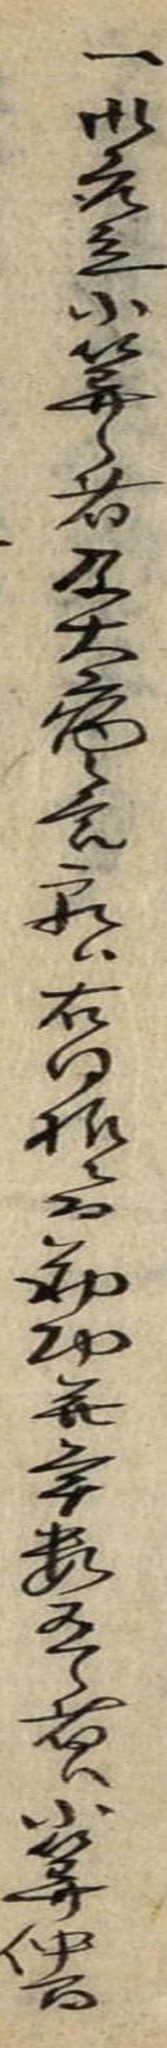一御取立小算之者及大病候節願は右同様に而勤切并年数有之者は小算仲間
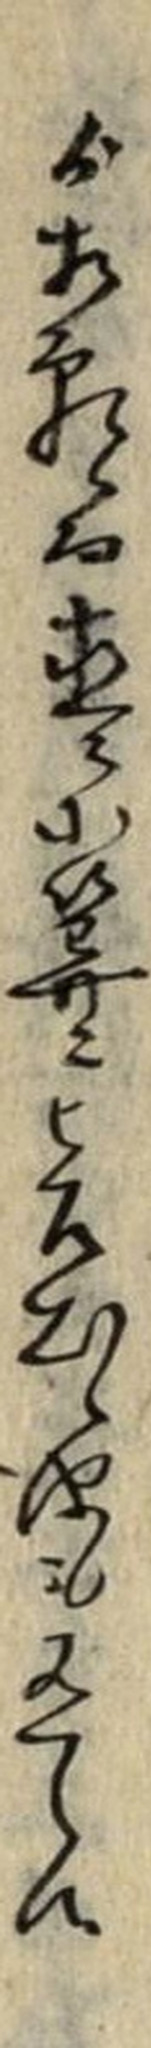ゟ相願候而直に小算に被召出候儀も有之候
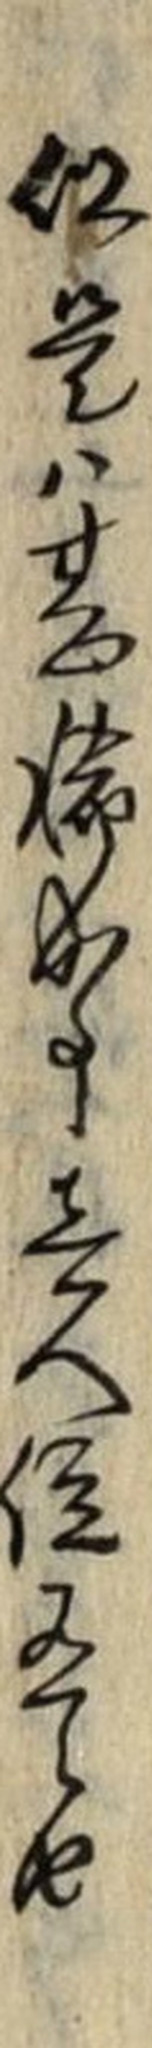但是は甚稀成事壱人位有之由
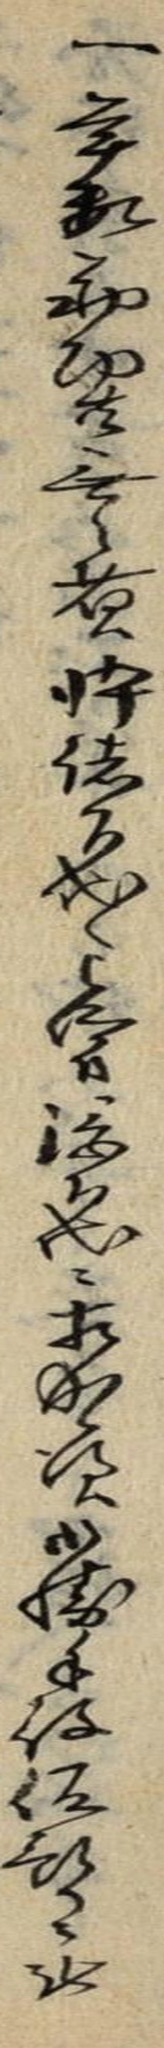一年数勤功共無之者は忰諸下代へ被仰付添下代に相成候得は御勝手役仮預りに被
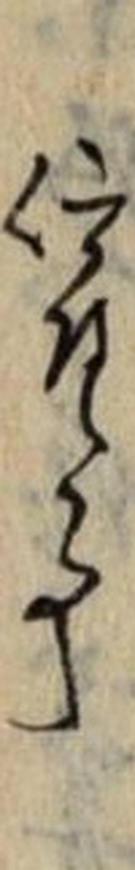仰付候事
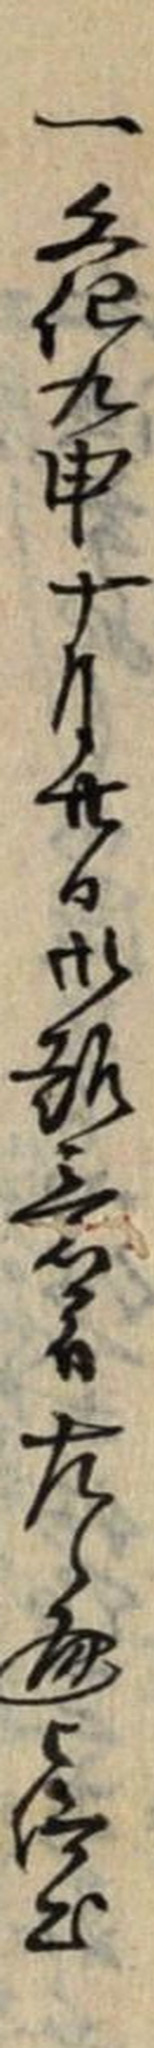一文化九申十月廿日御趣意に付左之通被仰出
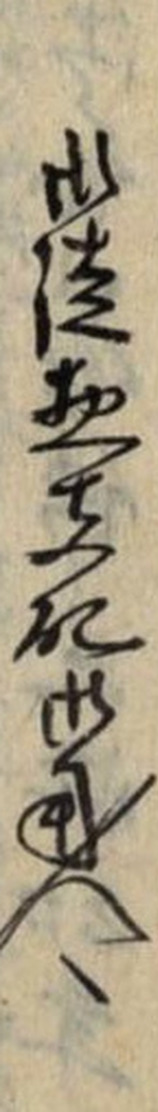御徒惣支配御用人へ
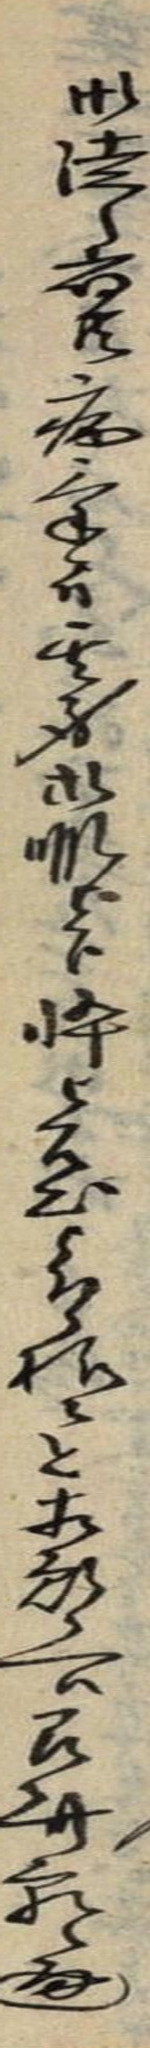御徒之者共病気に付其身御暇被下忰被召出被下候様にと相願候へは即刻願之通
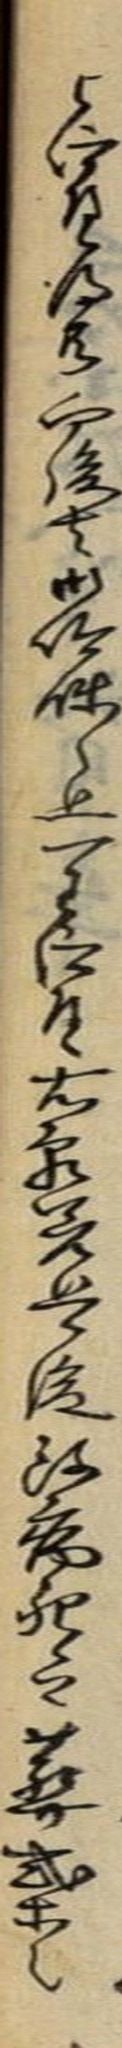被仰付候得共向後は御吟味之上可被仰付候右願差上候後致病死候はゝ葬式等之
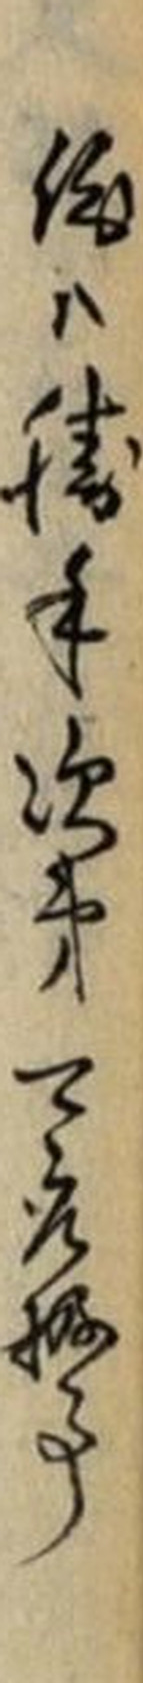儀は勝手次第可取扱候事
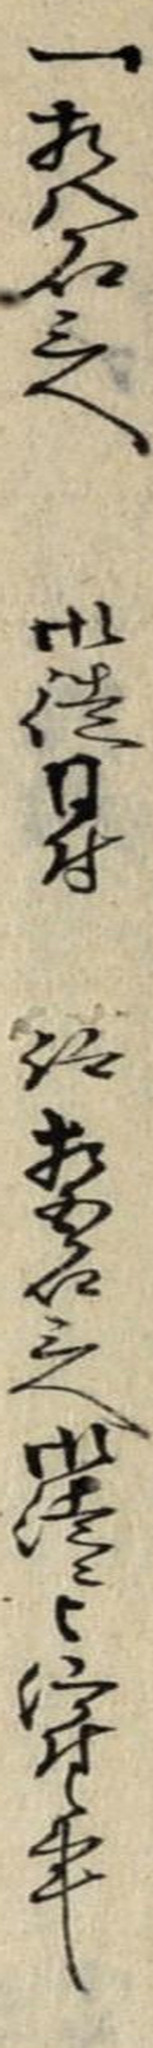一拾八石三人御徒目付跡拾五石三人御徒に被仰付候事
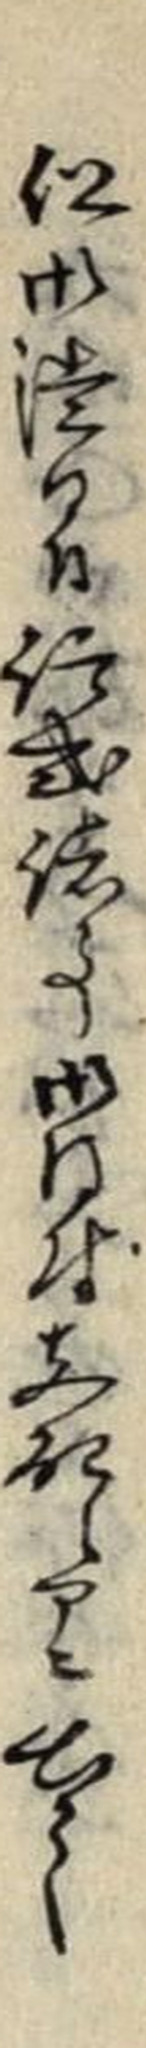但御徒目付跡式諸事御目付支配之部に出之
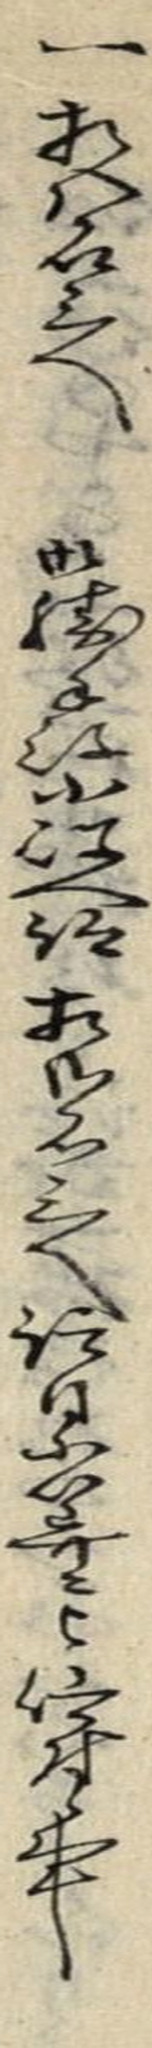一拾八石三人御勝手役小役人跡拾弐石三人跡目小算に被仰付候事
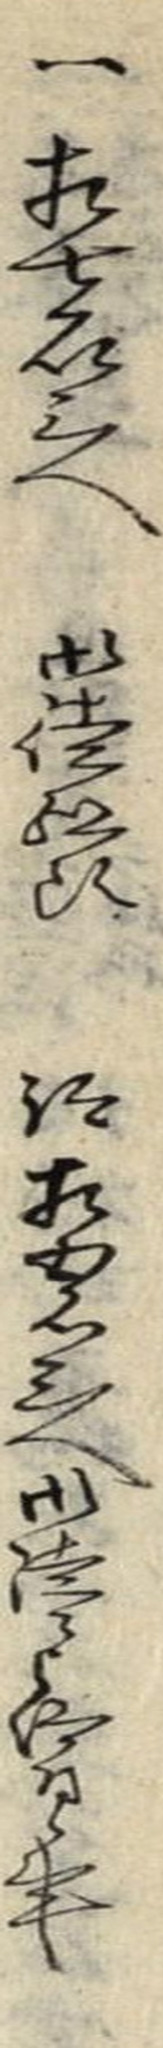一拾七石三人御徒組頭跡拾五石三人御徒に被仰付候事
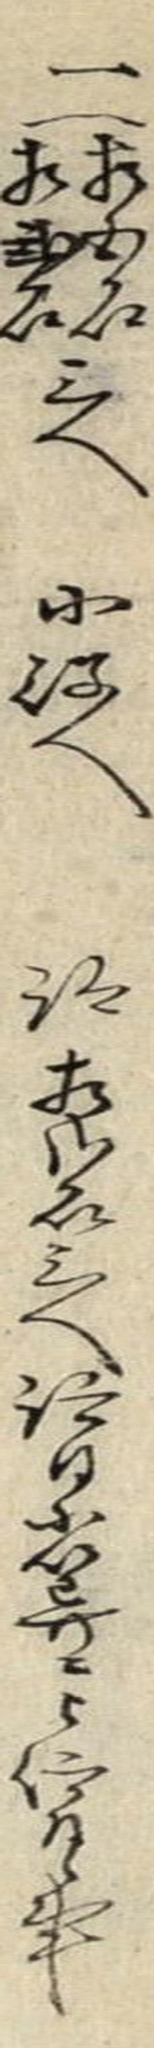一拾五石拾弐石三人小役人跡拾弐石三人跡目小算に被仰付候事
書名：御用并被仰出之部
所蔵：福井県文書館 Fukui Prefectural Archives
